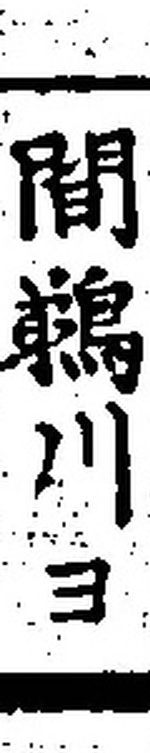間鵜川ヨ
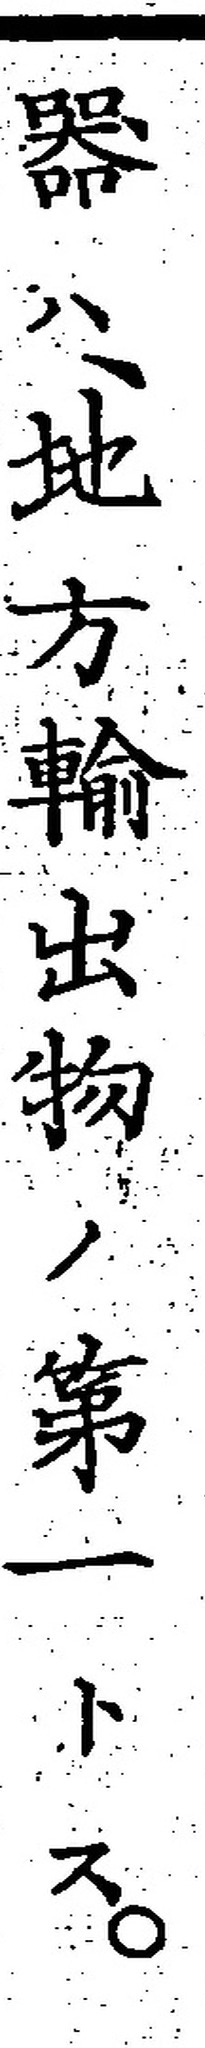器ハ、地方輸出物ノ第一トス。
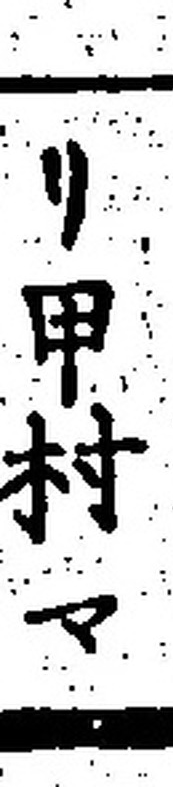リ甲村マ
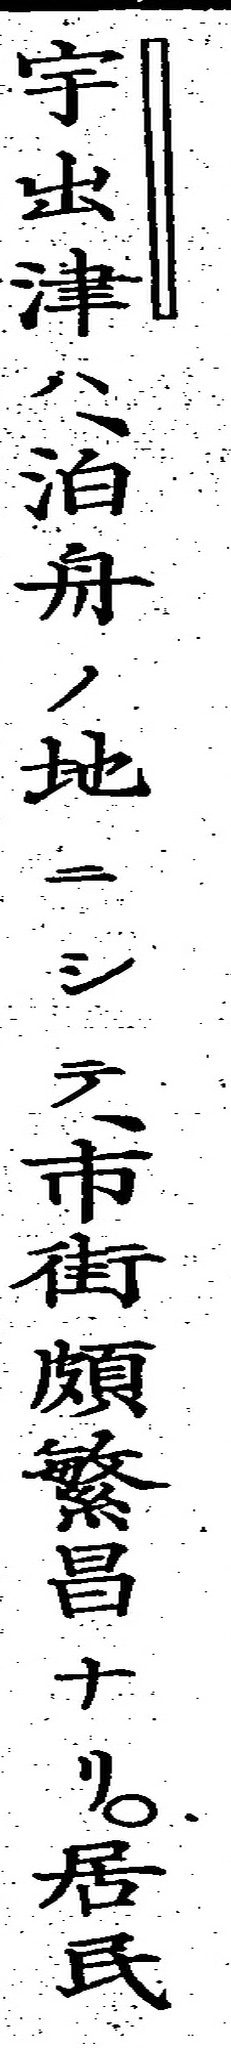宇出津ハ、泊舟ノ地ニシテ、市街頗繁昌ナリ。居民
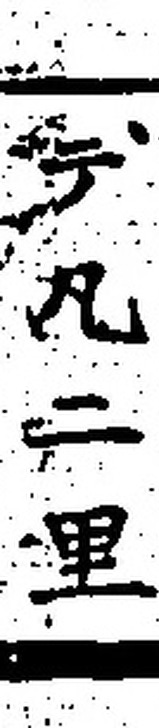デ凡二里
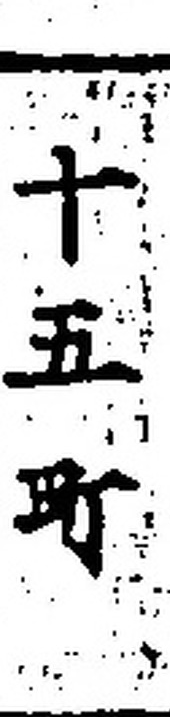十五町
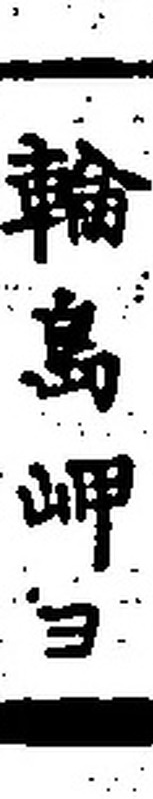輪島岬ヨ
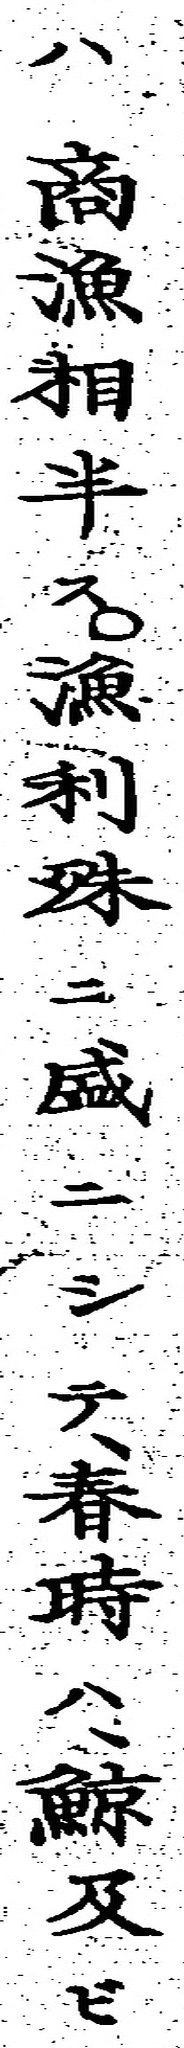ハ商漁相半ス。漁利殊ニ盛ニシテ、春時ハ、鯨及ビ
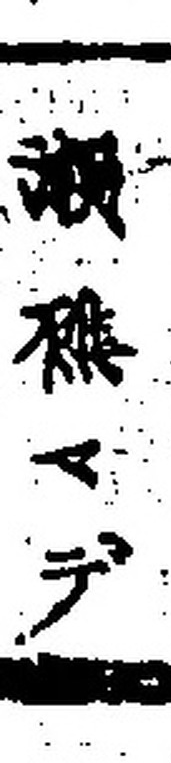瀬礁マデ
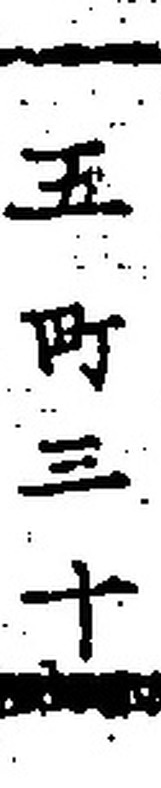五町三十
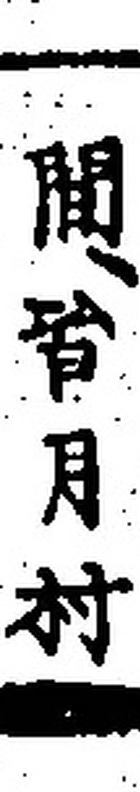間、皆月村
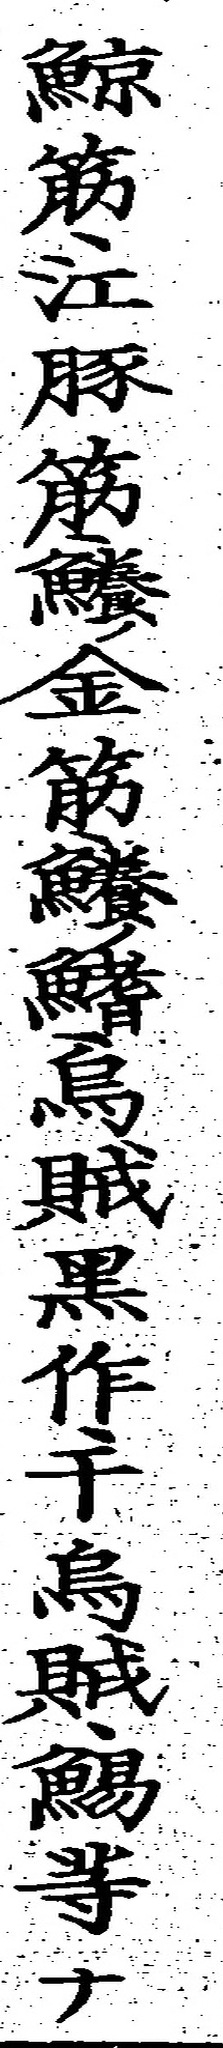鯨筋・江豚筋・鱶金筋・鱶鰭・烏賊黒作・干烏賊・鯣等ナ
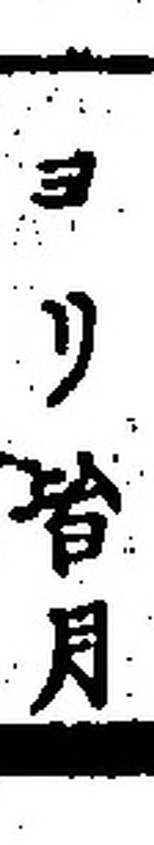ヨリ皆月
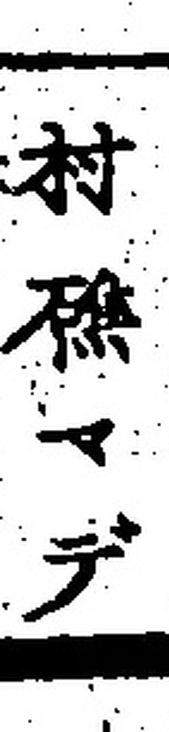村礁マデ
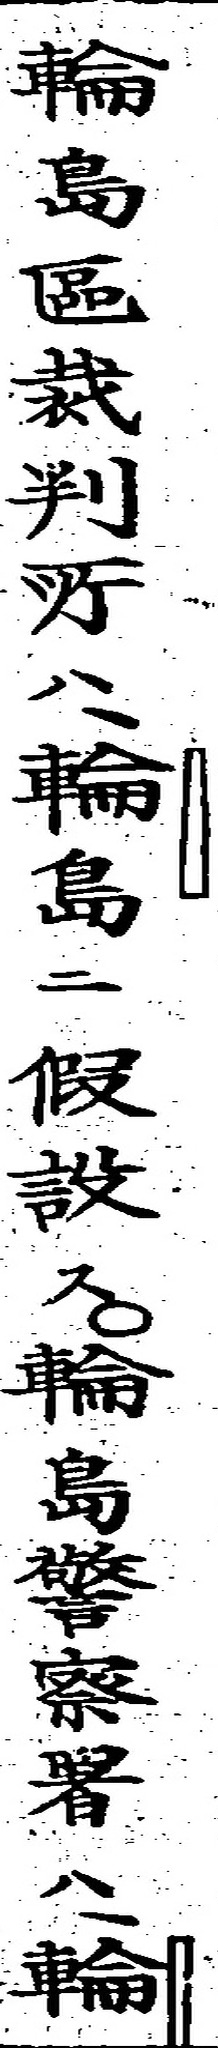輪島区裁判所ハ、輪島ニ仮設ス。輪島警察署ハ、輪
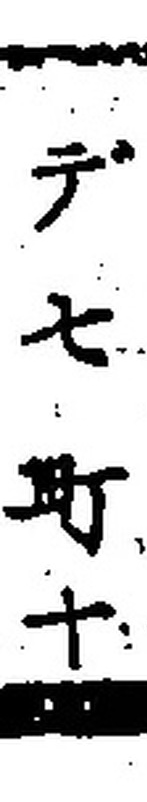デ七町十
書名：能登地誌略
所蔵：国立国会図書館 National Diet Library, JAPAN
